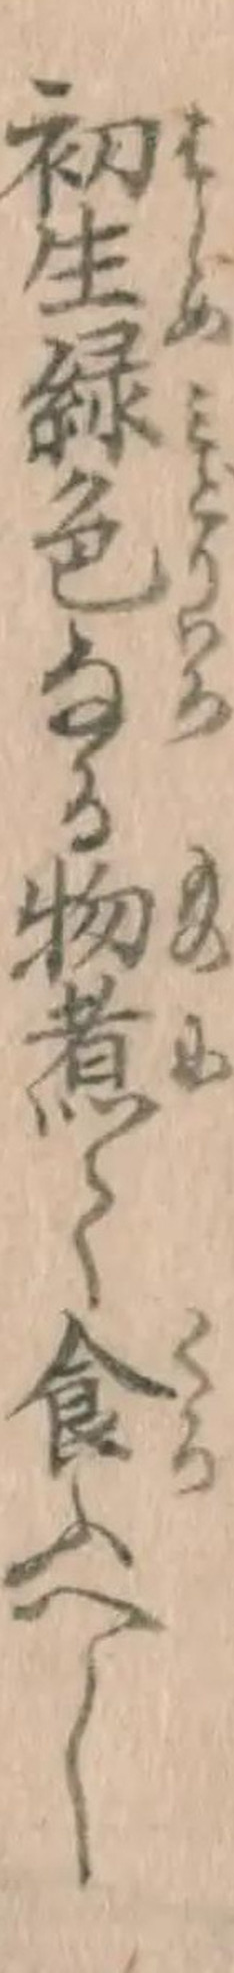初生緑色なる物煮て食ふへし
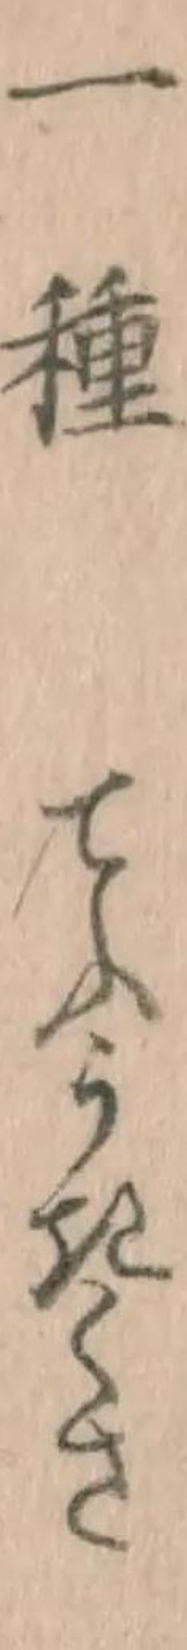一種てふうきくさ
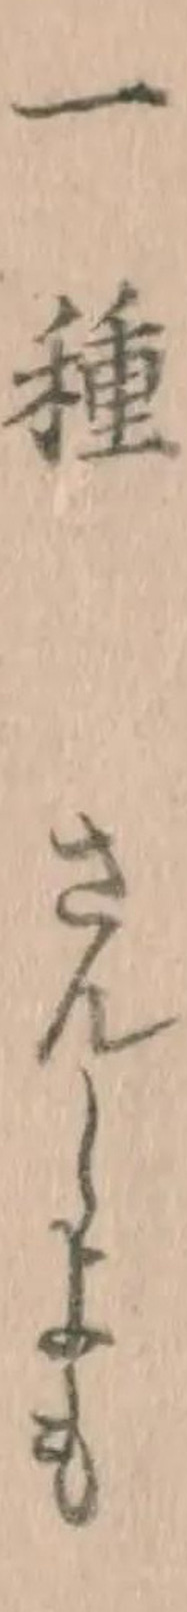一種さんしよも
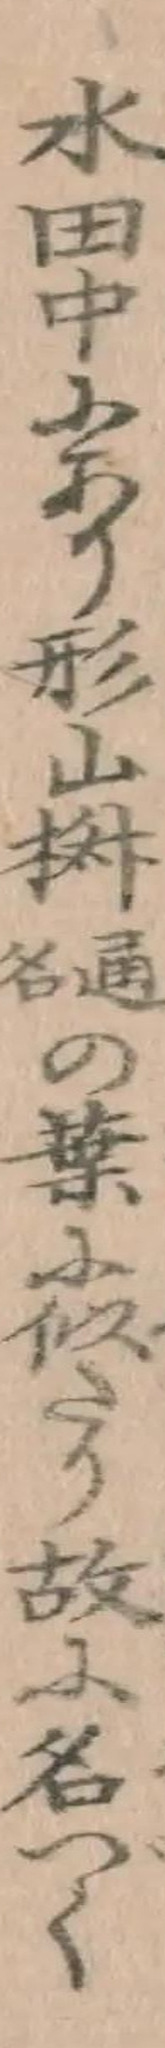水田中にあり形山桝通名の葉に似たり故に名づく
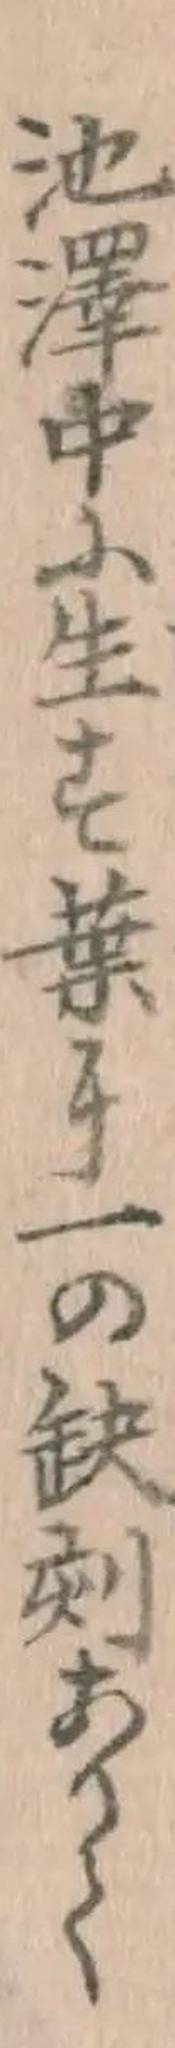池沢中に生す葉に一の欠刻ありて
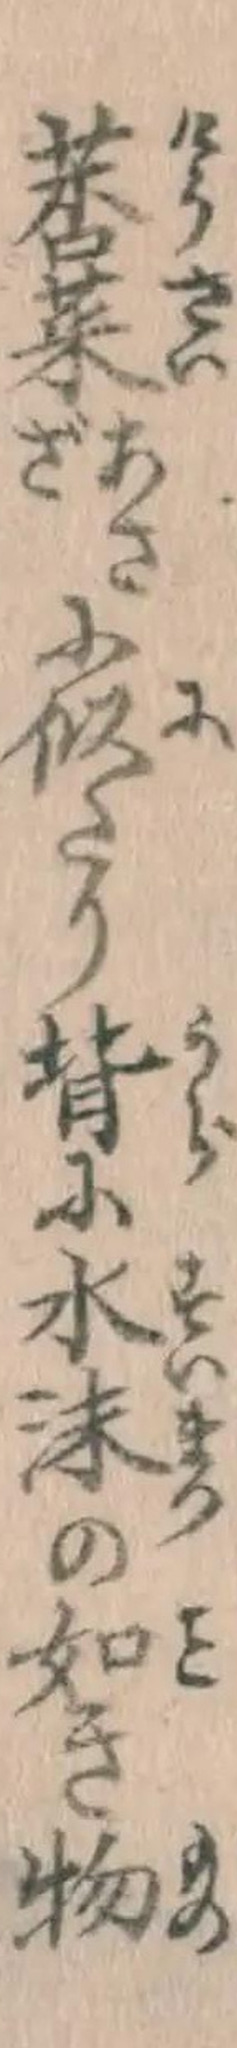莕菜あさざに似たり背に水沫の如き物
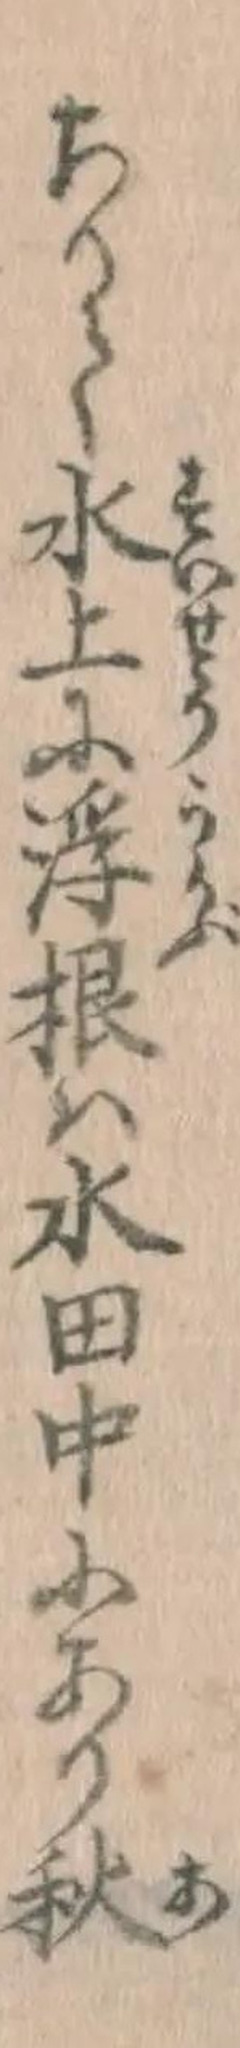ありて水上に浮根は水田中にあり秋

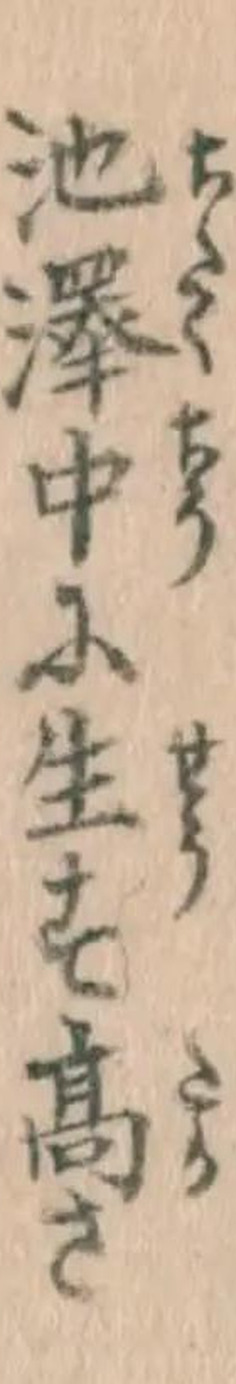池沢中に生す高さ
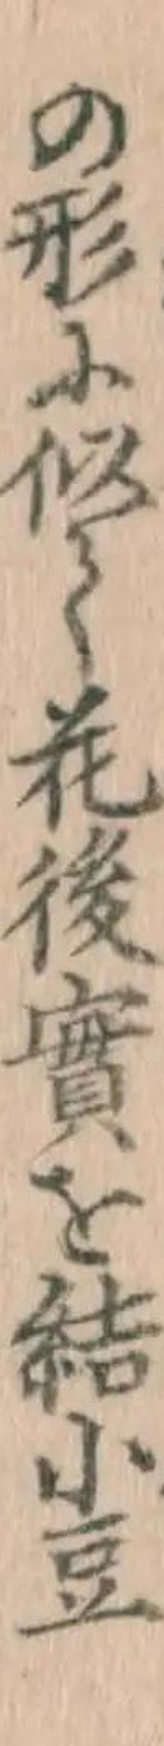の形に似て花後実を結小豆
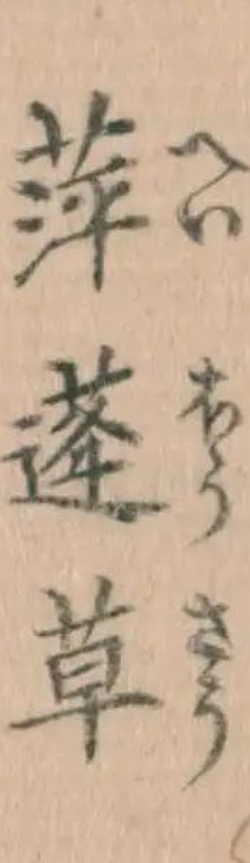萍蓬草
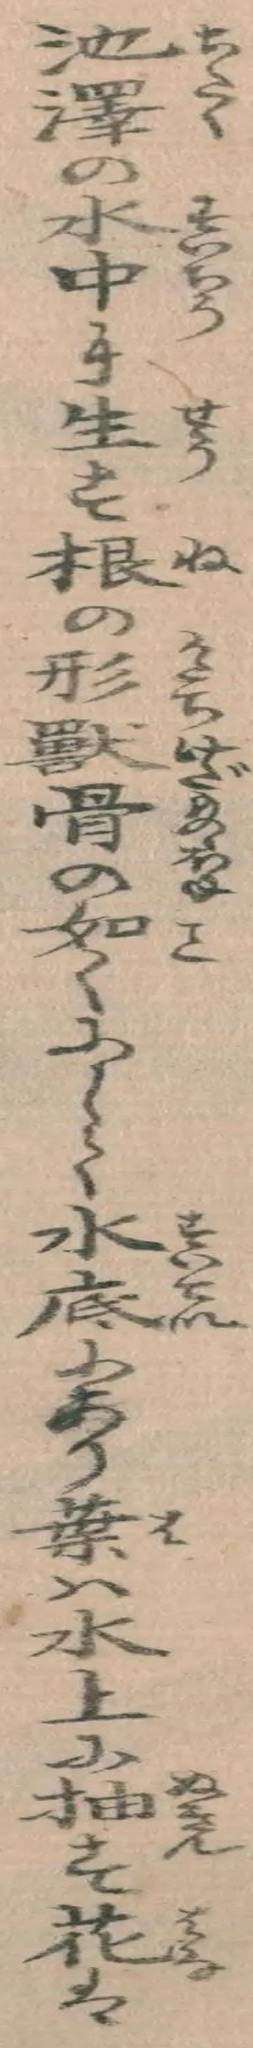池沢の水中に生す根の形獣骨の如くにして水底にあり葉は水上に抽す花は
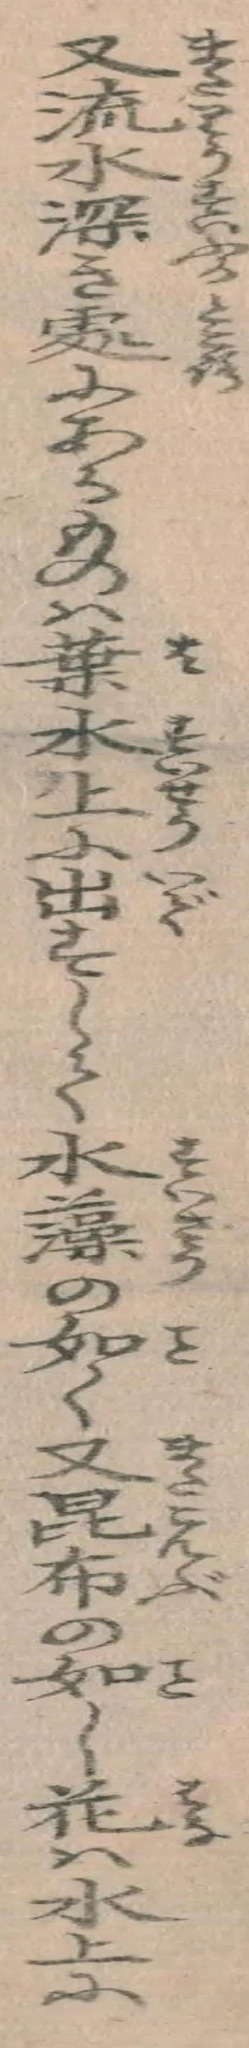又流水深き処にあるものは葉水上に出すして水藻の如く又昆布の如し花は水上に
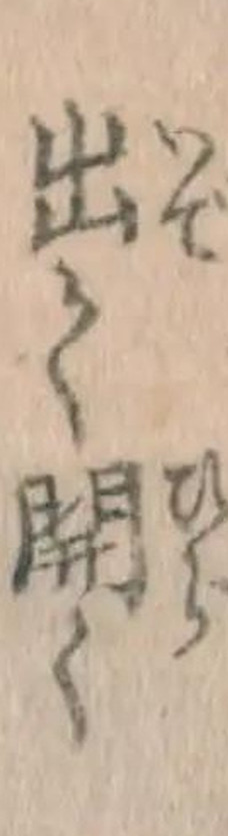出て開く

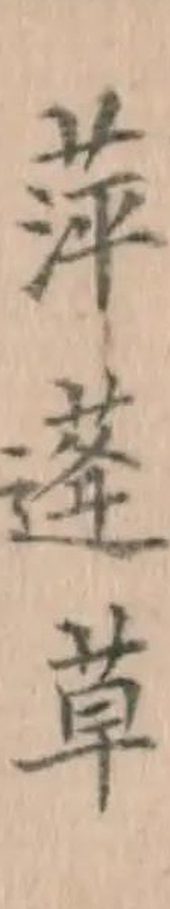萍蓬草
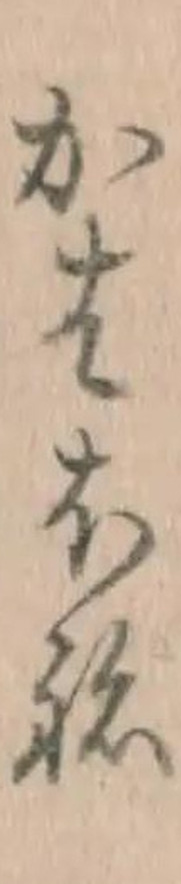かはほね

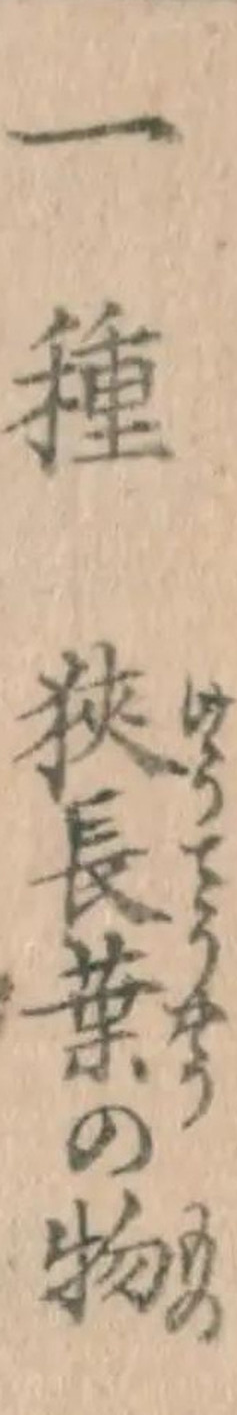一種狭長葉の物
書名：本草図譜. 巻34-36
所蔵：国立国会図書館 National Diet Library, JAPAN
